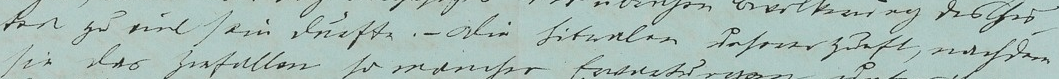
ten zu viel sein dürfte. – Die Liberalen unserer Zunft, nachdem
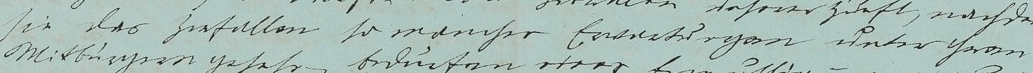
sie das Zerfallen so mancher Erwartungen unter ihren
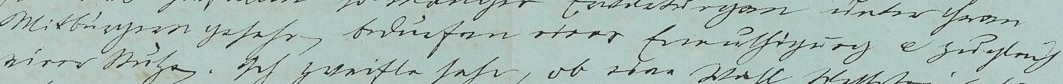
Mitbürgern gesehn, bedürfen einer Ermuthigung & zugleich
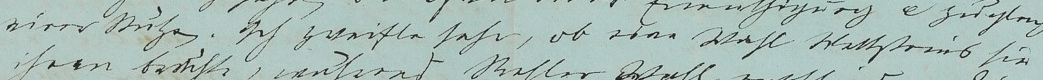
einer Stütze. Ich zweifle sehr, ob eine Wahl Wettsteins sie
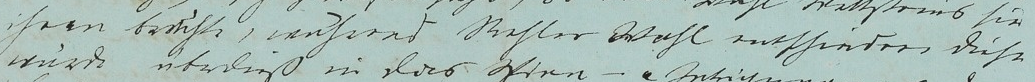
ihnen brächte, während Strehler Wahl entschieden Diese
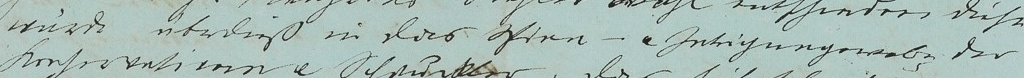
würde überdieß in das Spinn- & Intrigengewebe der
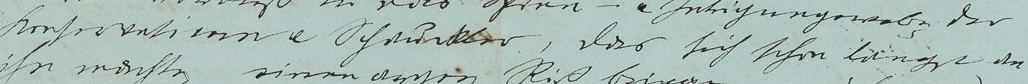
Konservativen & Schauckler, das sich schon längst an
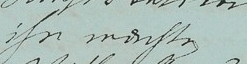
ihn machte,
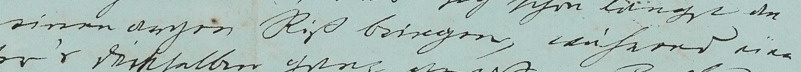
einen argen Riß bringen, während eine
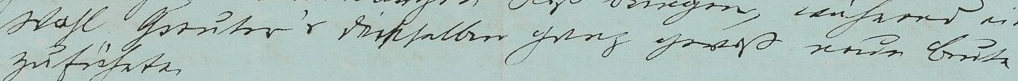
Wahl Greuter's denselben ganz gewiß neue Beute
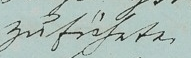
zuführte.
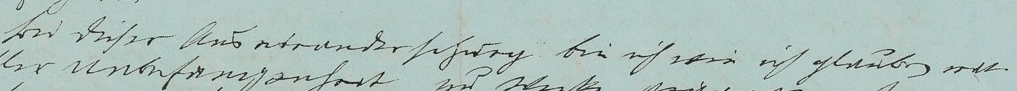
Bei dieser Auseinandersezung bin ich wie ich glaube mit
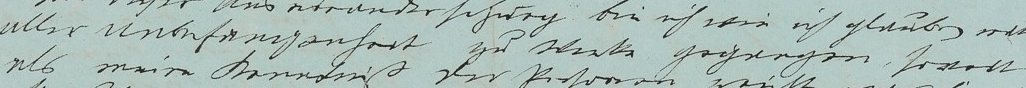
aller Unbefangenheit zu Werke gegangen, soweit
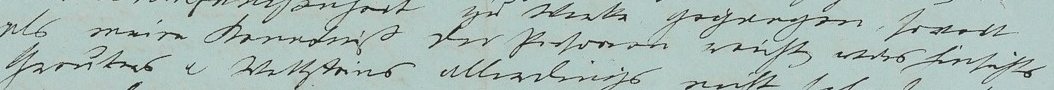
als meine Kenntniß der Personen reicht, was hinsichts
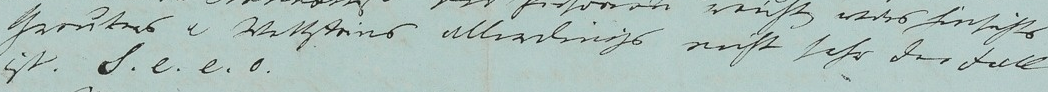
Greuters & Wettsteins allerdings nicht sehr der Fall
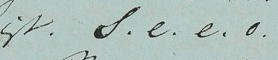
ist. S. e. e. o.
